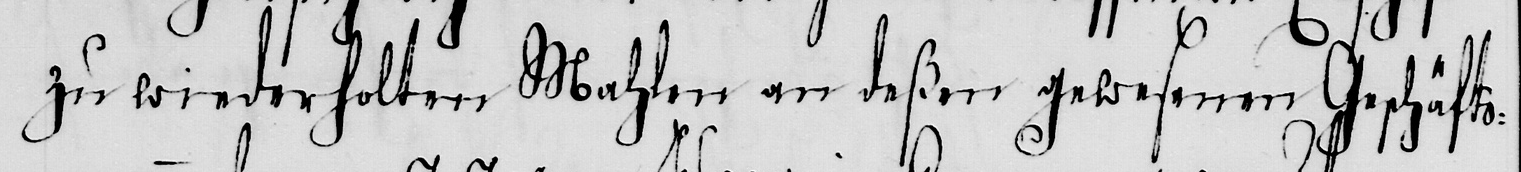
zu wiederholten Mahlen an deßen gewesenen Geschäft¬
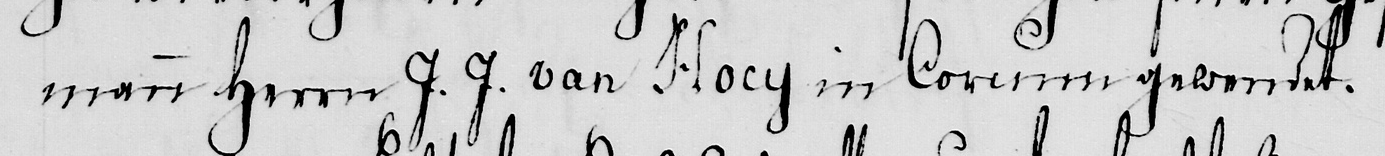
smann Herrn J. J. van Hocy in Corcum gewendet.
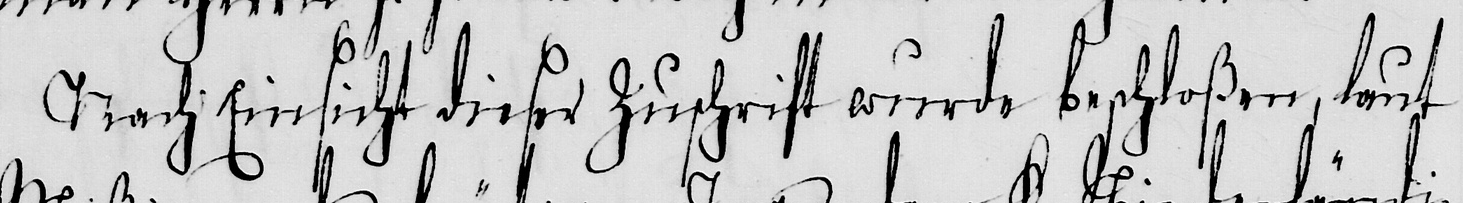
Nach Einsicht dieser Zuschrift wurde beschloßen, laut
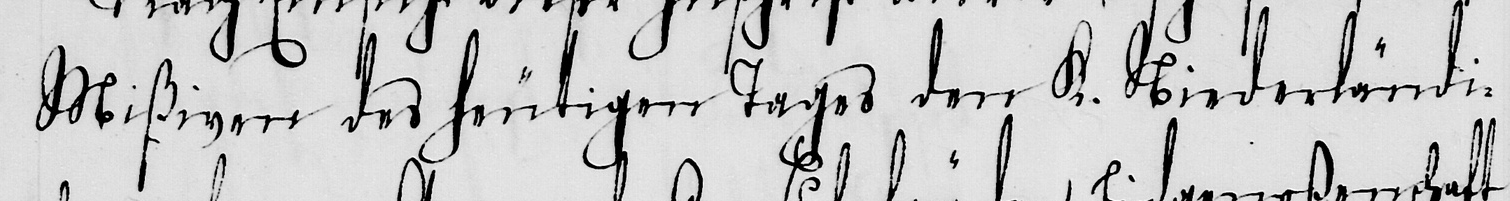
Mißiven des heutigen Tages den K. Niederländi¬
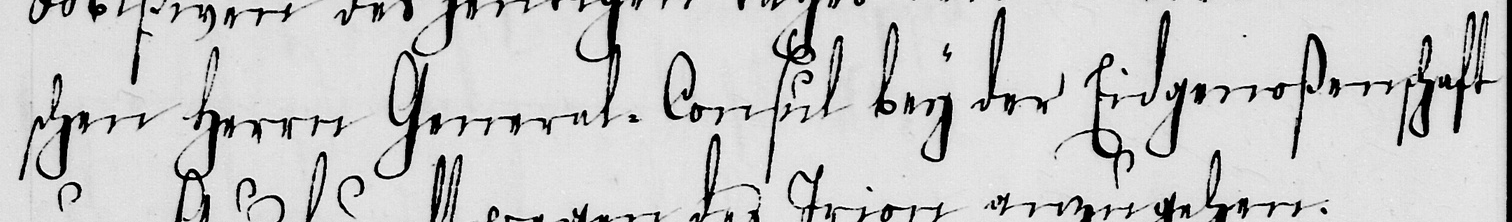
schen Herrn General-Consul bey der Eidgenoßenschaft
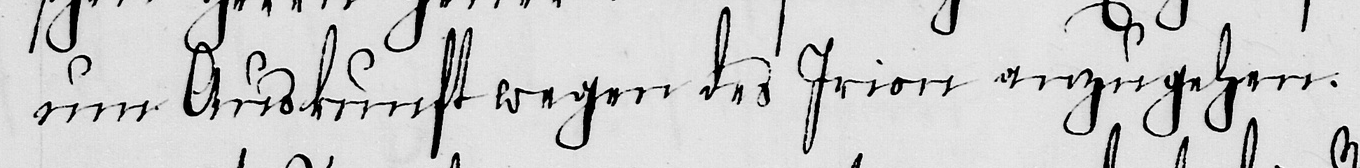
um Auskunft wegen des Irion anzugehen.
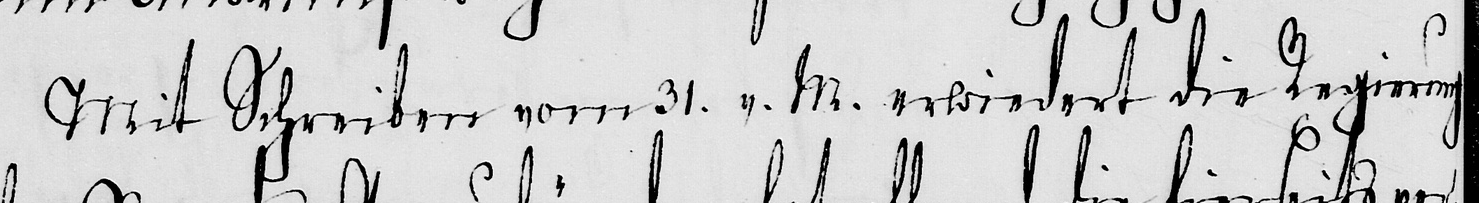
Mit Schreiben vom 31. v. M. erwiedert die Regierung
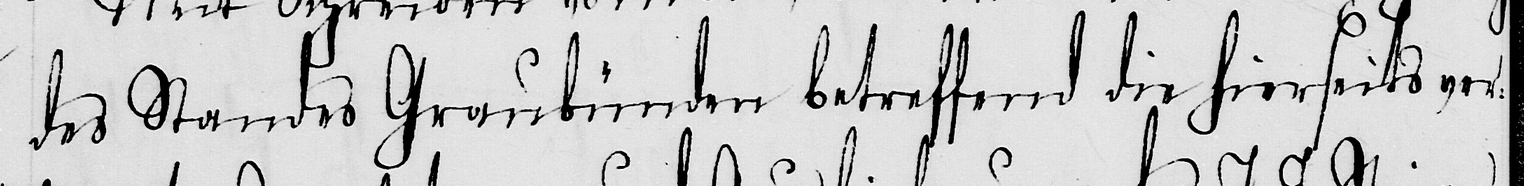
des Standes Graubünden betreffend die hierseits ver¬
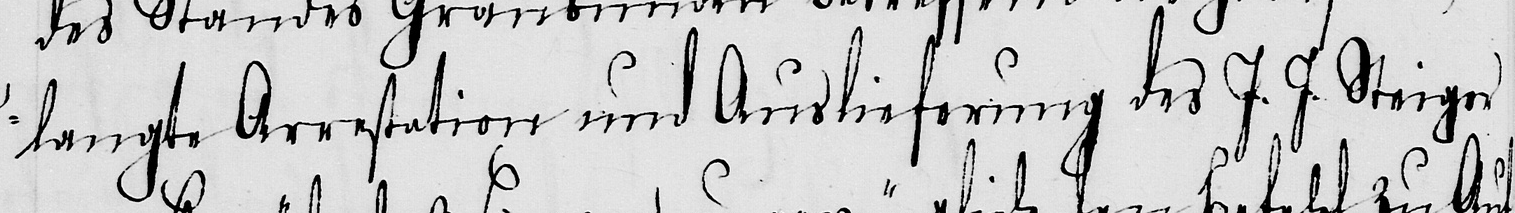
langte Arrestation und Auslieferung des J. J. Steiger
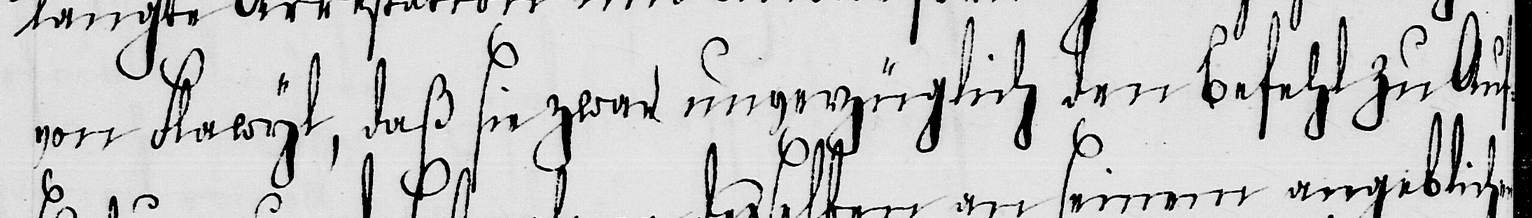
von Flawyl, daß sie zwar unverzüglich den Befehl zu Auf¬
